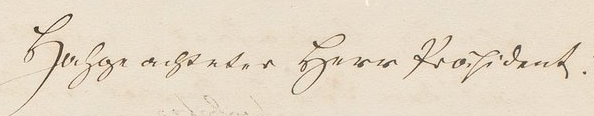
Hochgeachteter Herr Präsident!
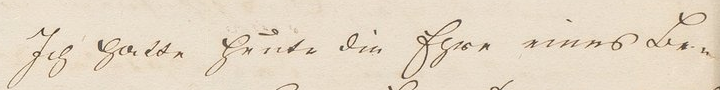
Ich hatte heute die Ehre eines Be-
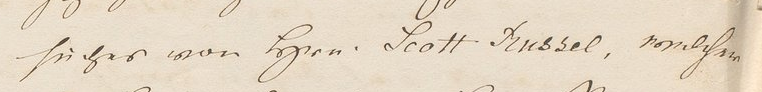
suches von Hrn. Scott Russel, welcher
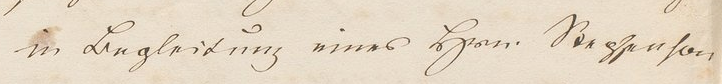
in Begleitung eines Hrn. Stephenson
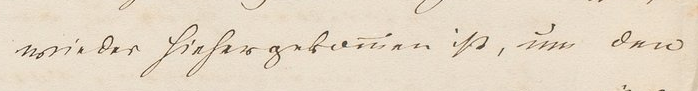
wieder hiehergekommen ist, um den
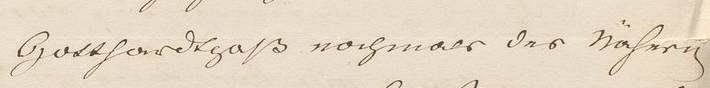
Gotthardtpaß nochmals des Nähern
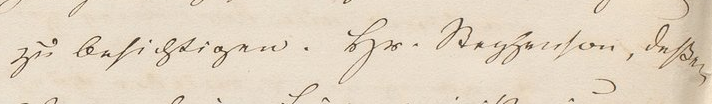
zu besichtigen. Hr. Stephenson, deßen
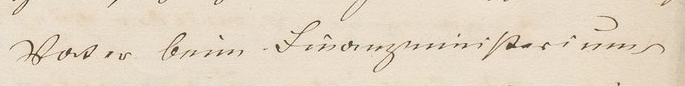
Vater beim Finanzministerium
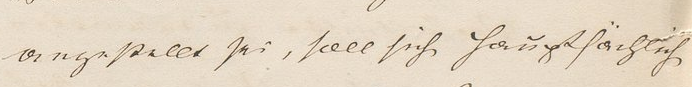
angestellt sei, soll sich hauptsächlich
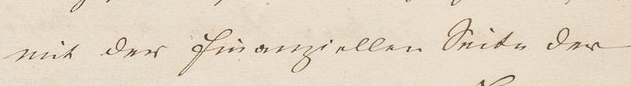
mit der finanziellen Seite der
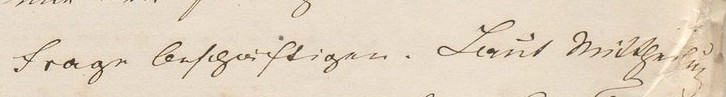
Frage beschäftigen. Laut Mittheilung
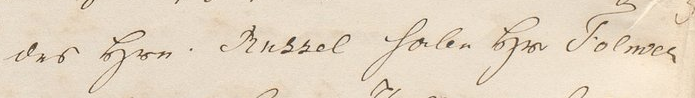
des Hrn. Russel habe Hr Folmer
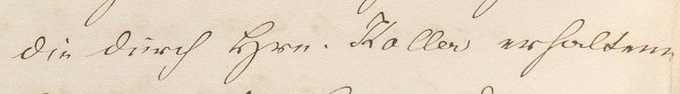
die durch Hrn. Koller erhaltene
